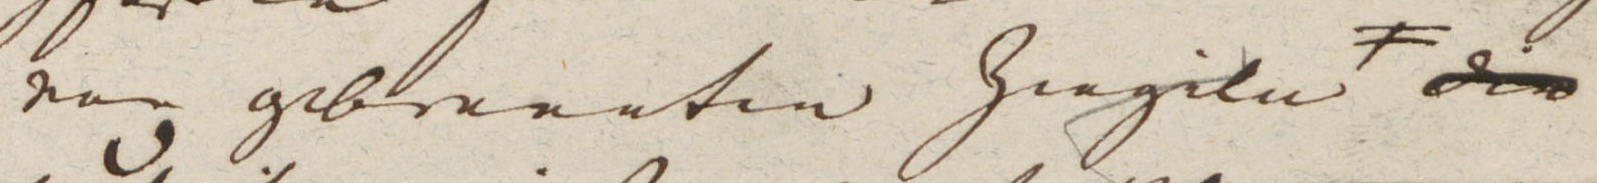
von gebrannten Ziegeln % die
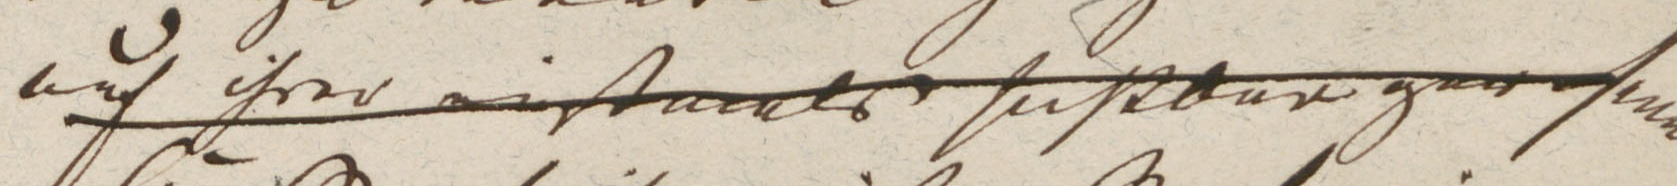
auf ihrer einstmals sichtbar gewesenen
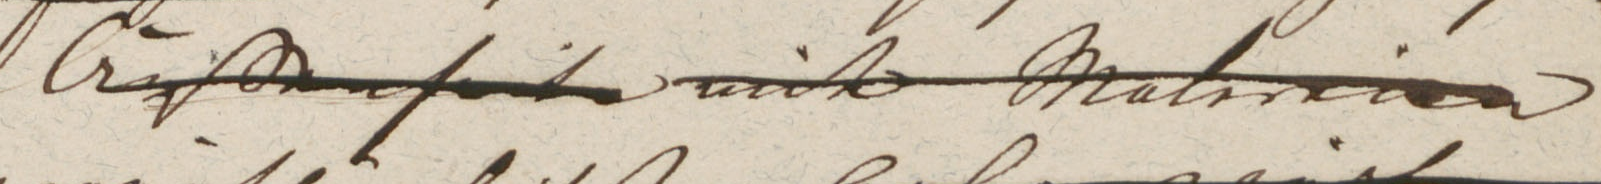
Aussenseite mit Malereien
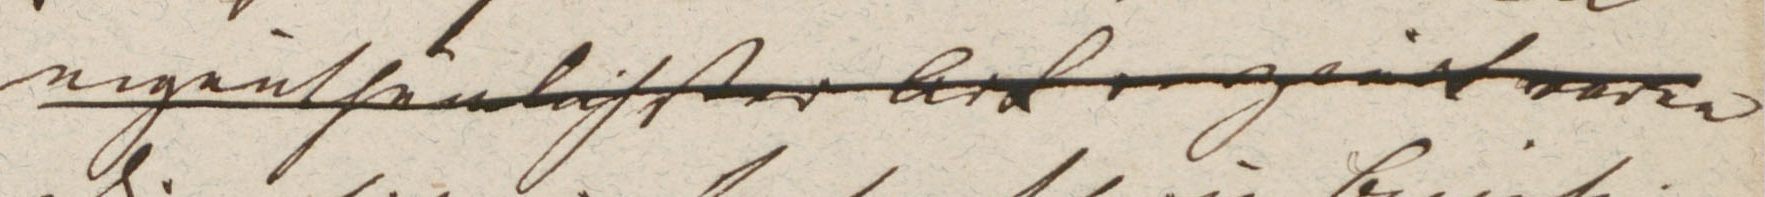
eigenthümlichster Art verziert waren
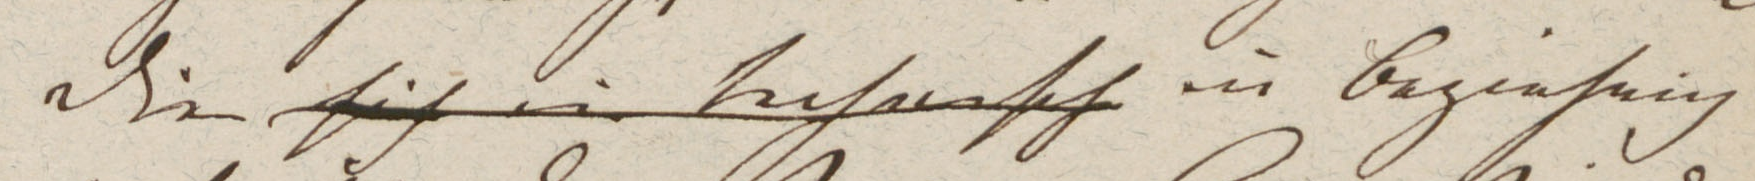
die sich in technisch in Beziehung
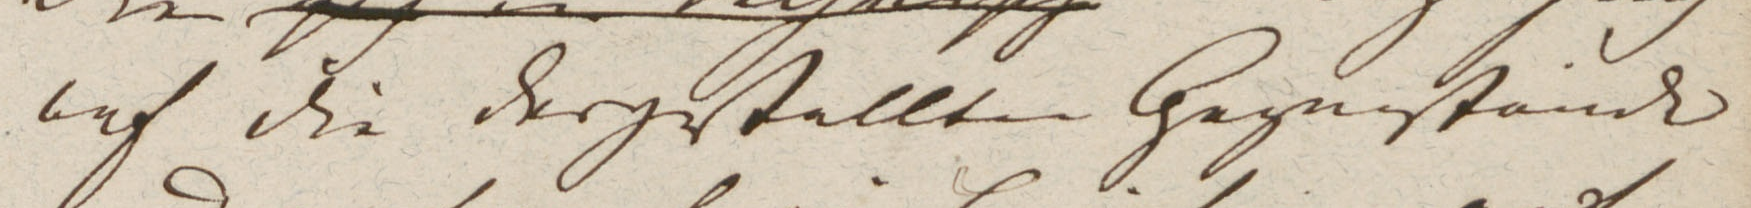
auf die dargestellten Gegenstände
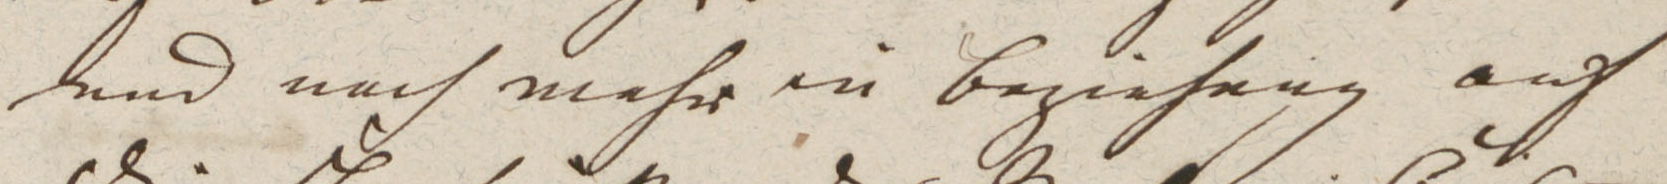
und noch mehr in Beziehung auf
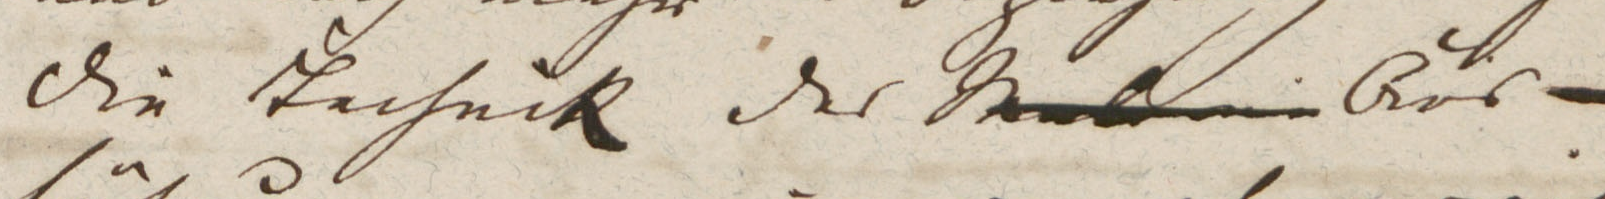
die Technik der Malerei Aus-
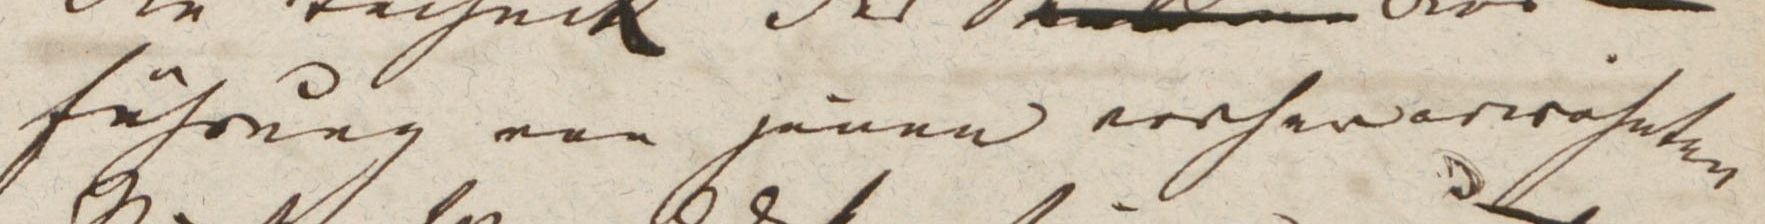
führung von jenen vorher erwähnten
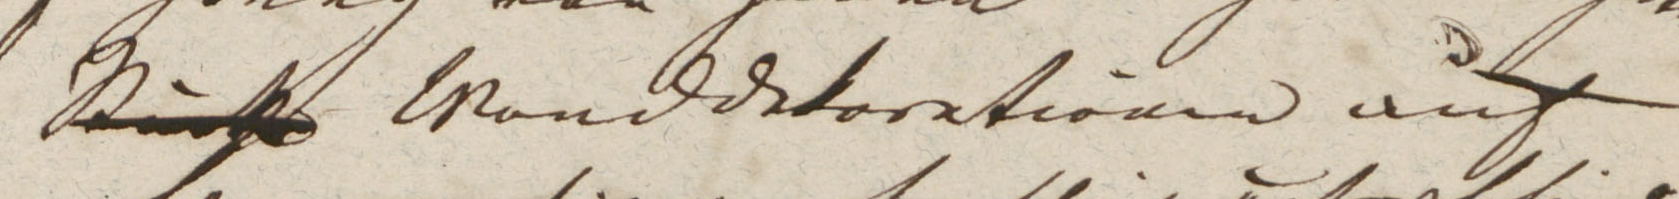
Stuck Wanddekorationen auf
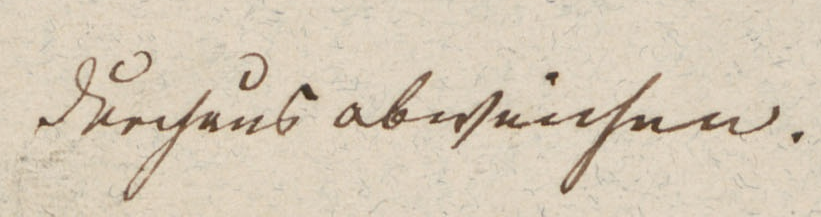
durchaus abweichen.
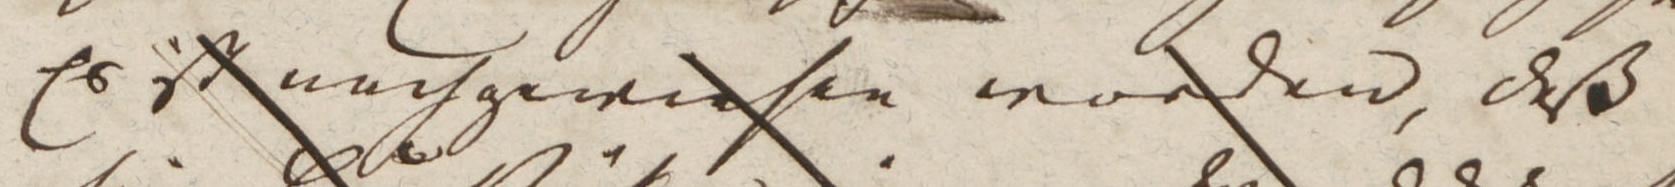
Es ist nachgewiesen worden, dass
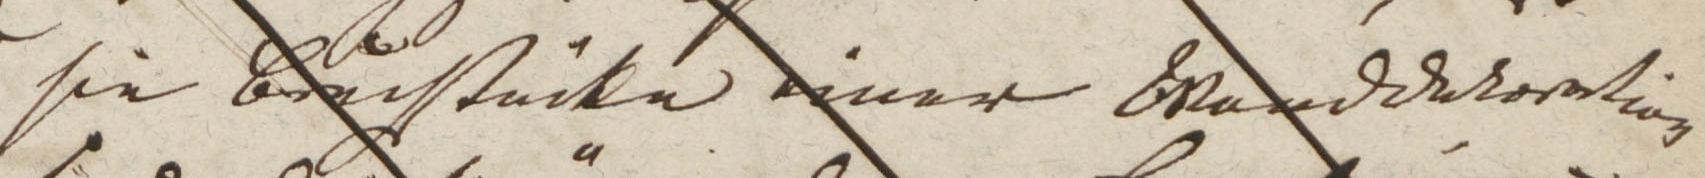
sie Bruchstücke einer Wanddekoration
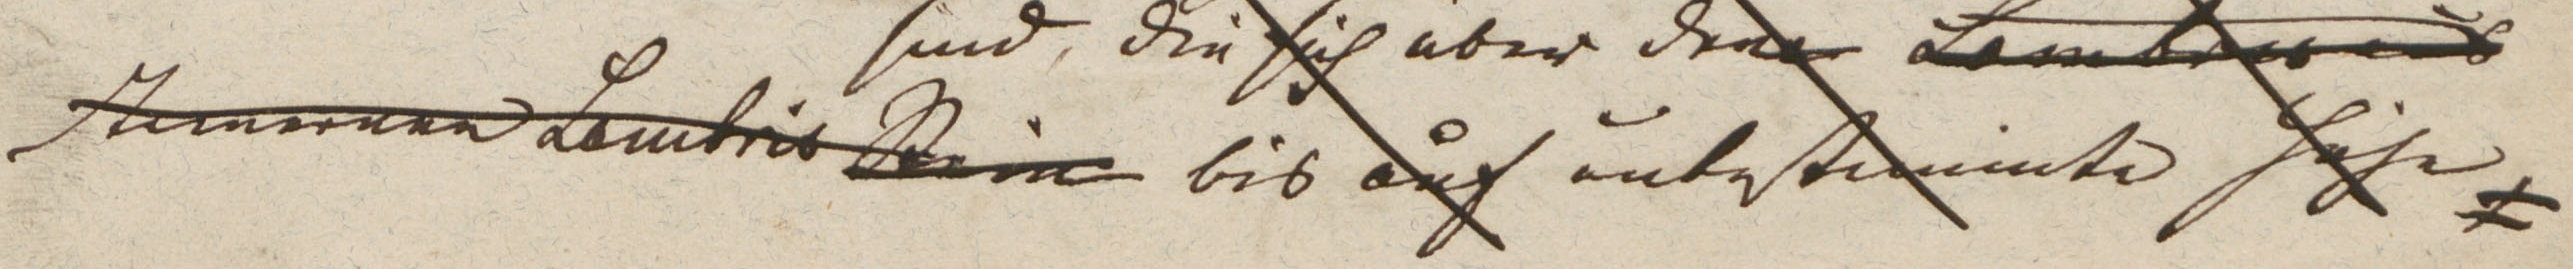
steinernen Lambris Stein bis auf unbestimmte Höhe %
